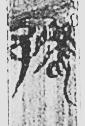{邑寽虎}
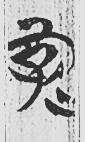乳=
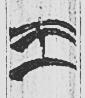王
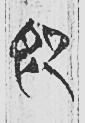即
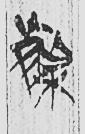殜
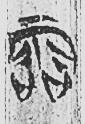霝
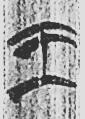王
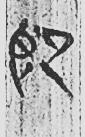即
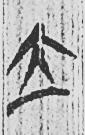立
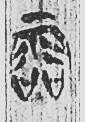霝
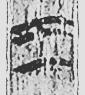王
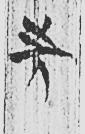先
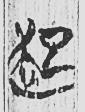起
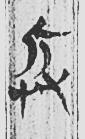兵
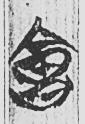會
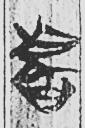者
